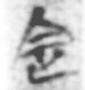定
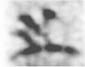之
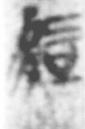騏
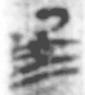爲
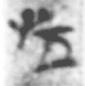○（左）
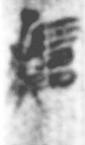驂
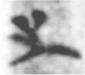之
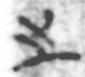之
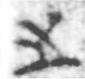之
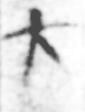大
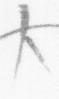大
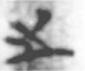之
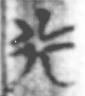行
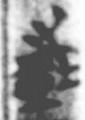○（廣）
